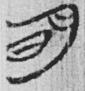明
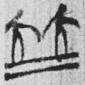並
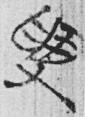受
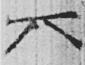亓（其）
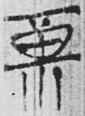福
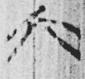六
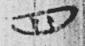四
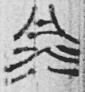汬
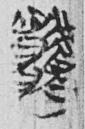○（甃）
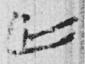亡
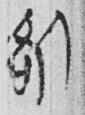咎
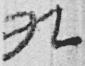九
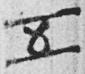五
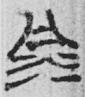汬
